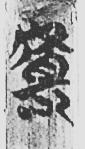虘B
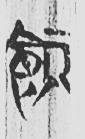飢
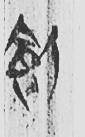飤
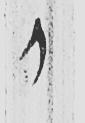人
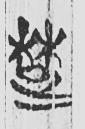楚
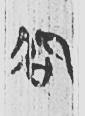卲
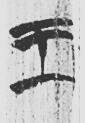王
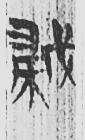{帚戈}
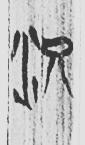{水尹}
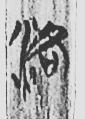洛
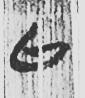㠯（以）
